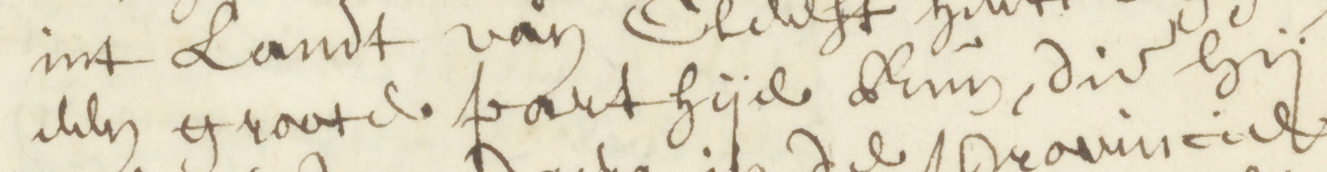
een groote parthije Run, die hij
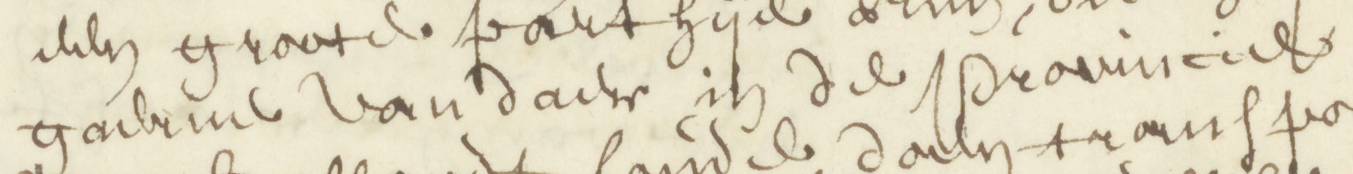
gaerne van daer in de provincie
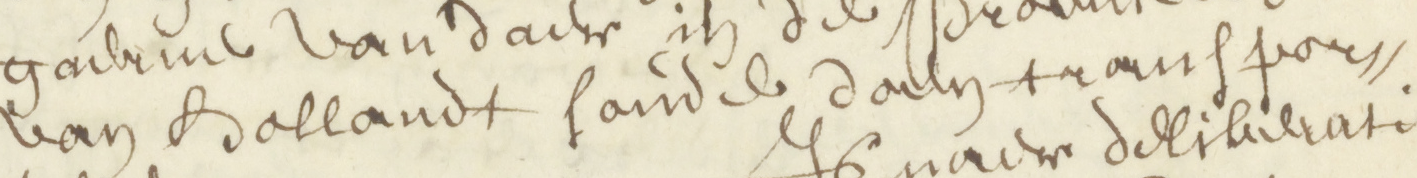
van Hollandt soude doen transpor„
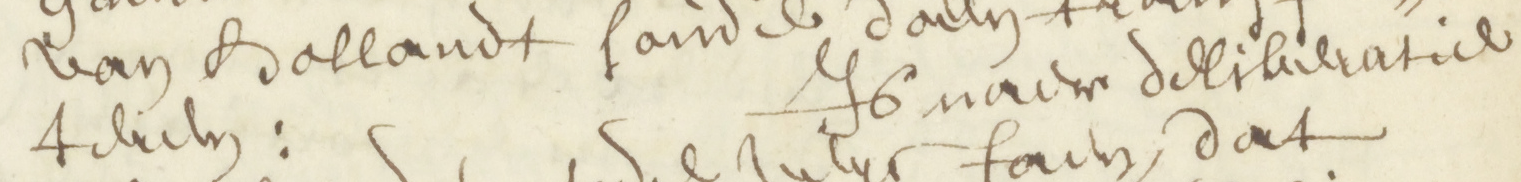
teren: Is naer deliberatie
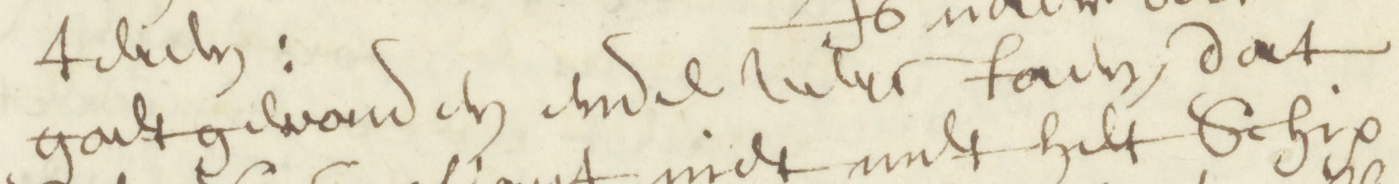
goetgevonden ende verstaen, dat
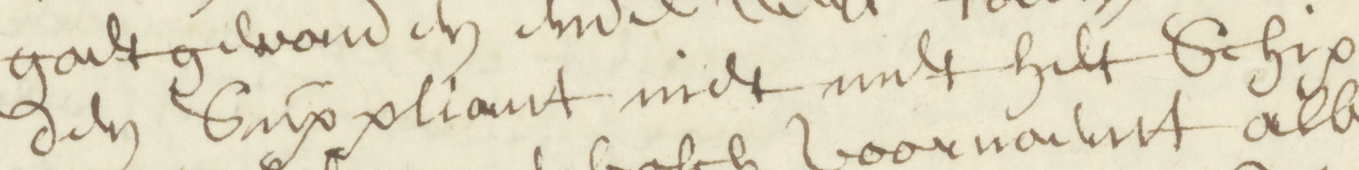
den Suppliant niet met het Schip
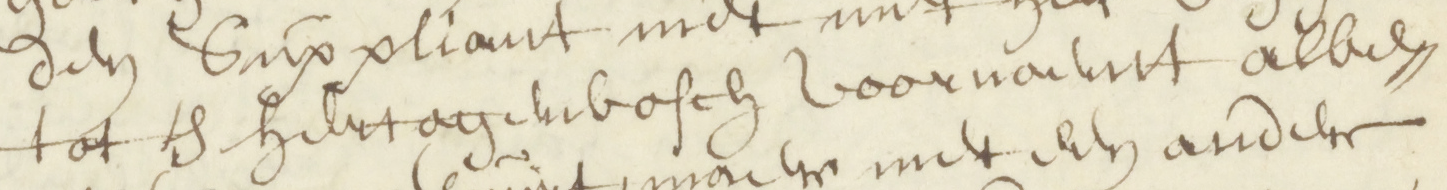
tot ‛s Hertogenbosch voornoemt albe„
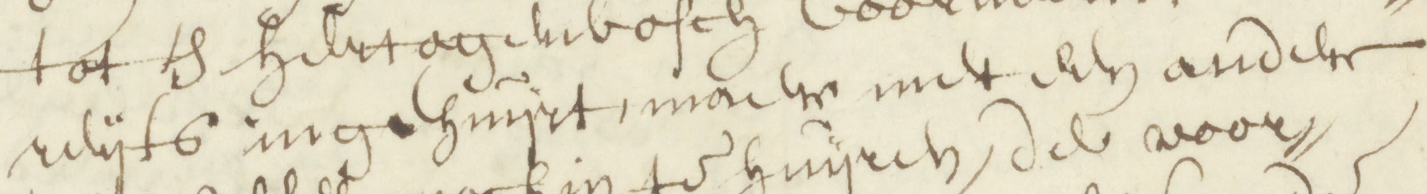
reijts ingehuijrt, maer met een ander
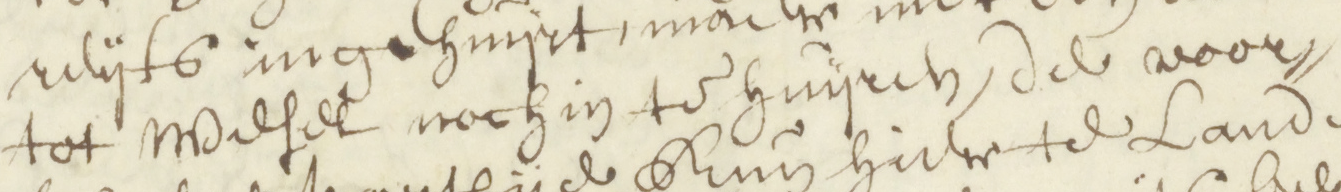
tot Wesel noch in te huijren, de voor„
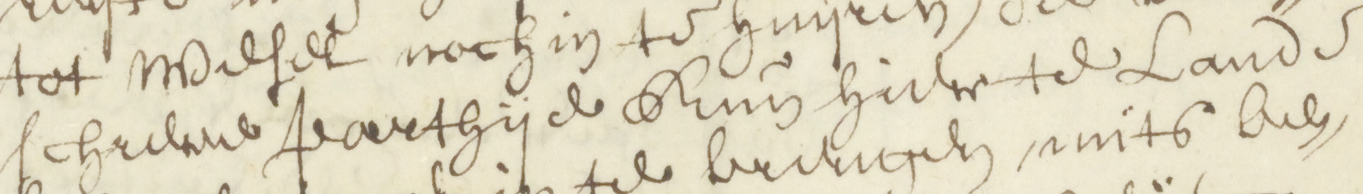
schreve parthije Run hier te Lande
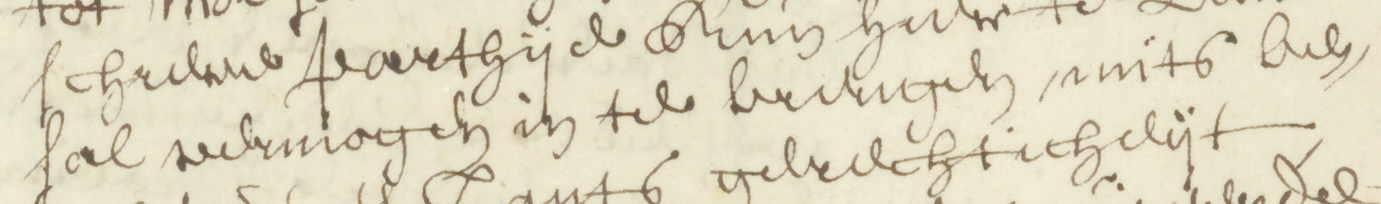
sal vermogen in te brengen, mits be„
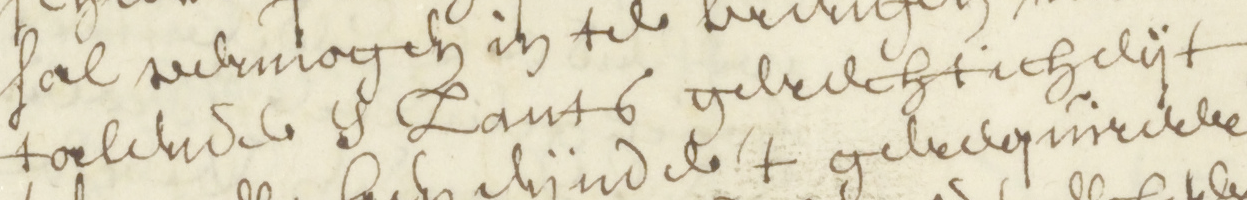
talende ‛s Lants gerechticheijt,
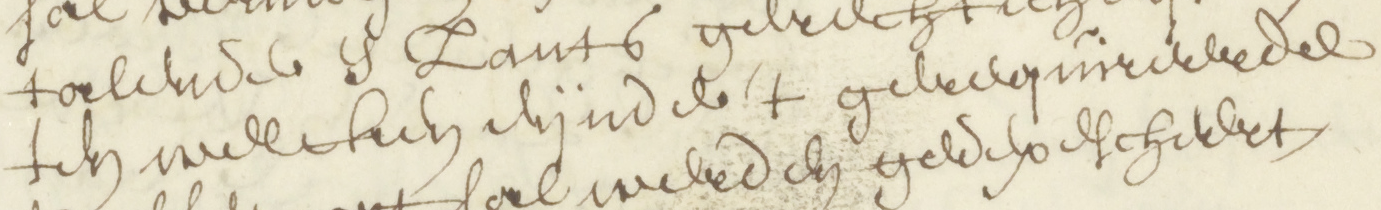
ten welcken eijnde 't gerequireerde
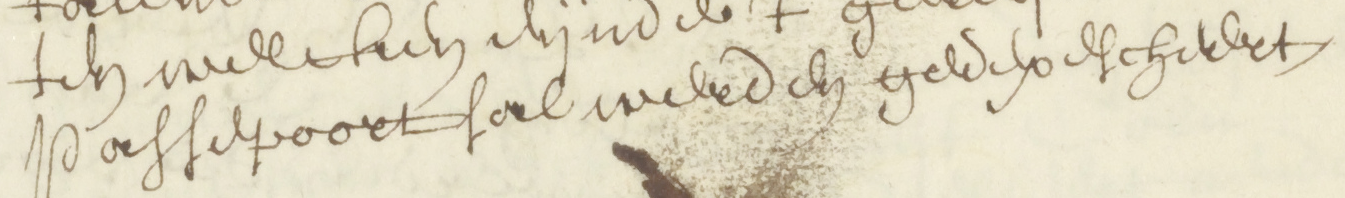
passepoort sal werden gedepescheert.
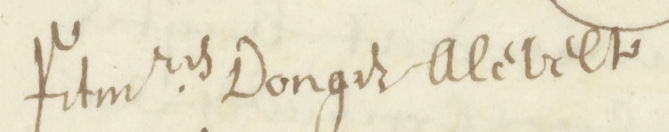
Ritmren. Dongen Alevelt
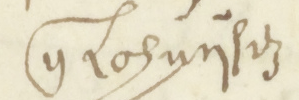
& Lohuijsen
